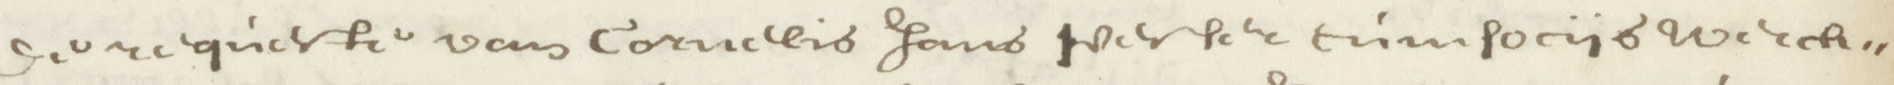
De requeste van Cornelis Jans Pesser cum socijs werck„
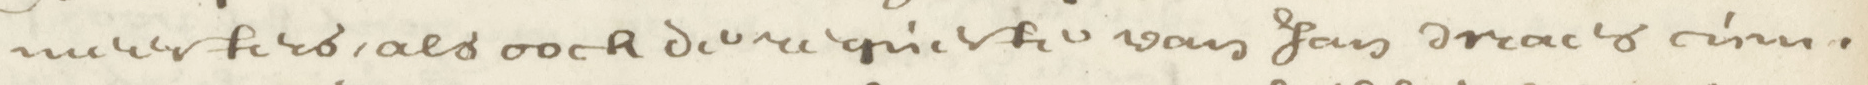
meesters, als oock de requeste van Jan Maes cum
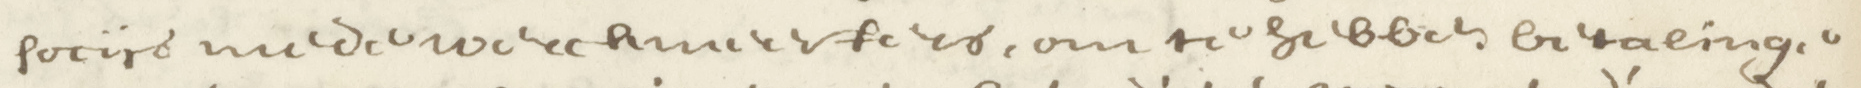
socijs mede werckmeesters, om te hebben betalinge
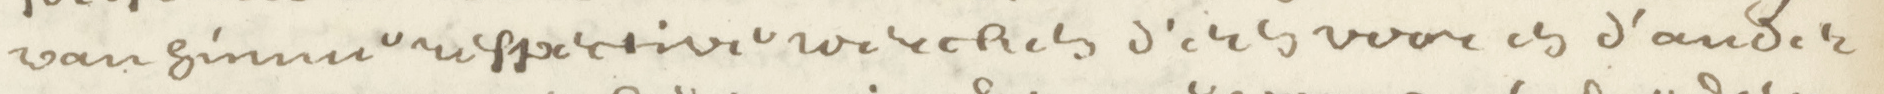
van hunne respective wercken d'enen voor en d'ander
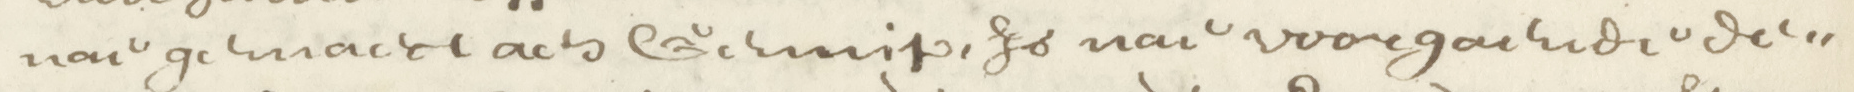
nae gemaeckt aen Gennep, Is nae voorgaende de„
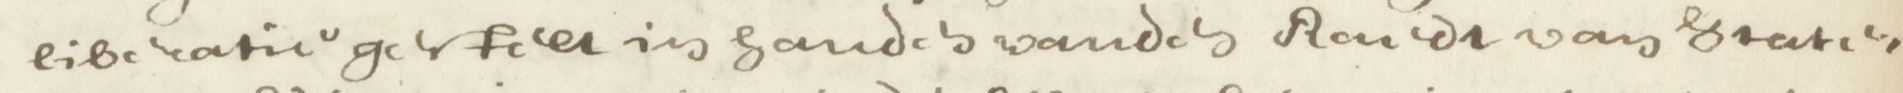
liberatie gestelt in handen van den Raedt van State,
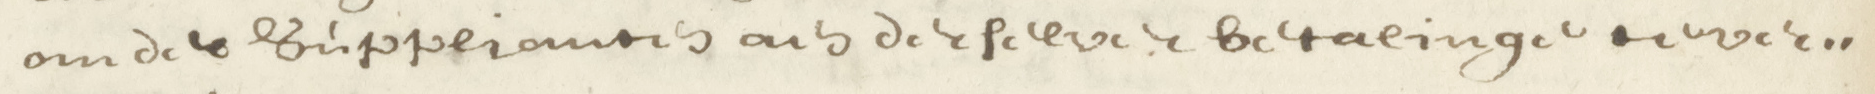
om den Supplianten aen derselver betalinge te ver„
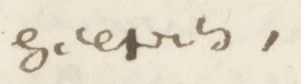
helpen.
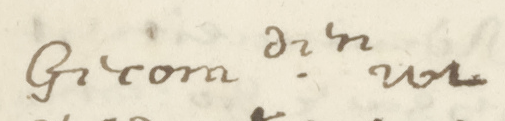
Gecomden. wt
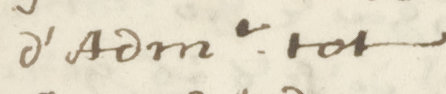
d'Admt. tot
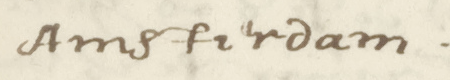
Amsterdam.
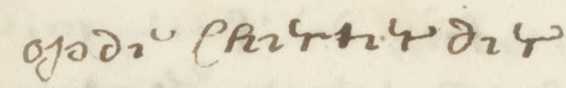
opde cherter der
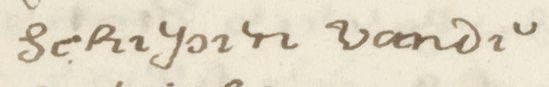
schepen van de
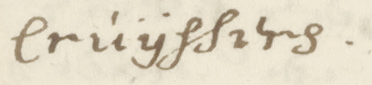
cruijssers.
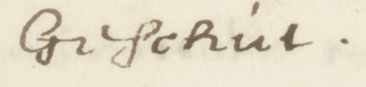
Geschut.
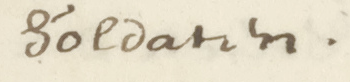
Soldaten.
